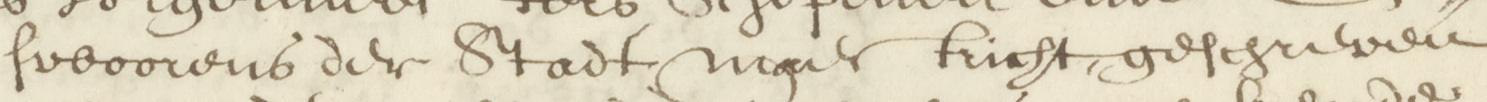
swoorens der Stadt Maestricht, geschreven
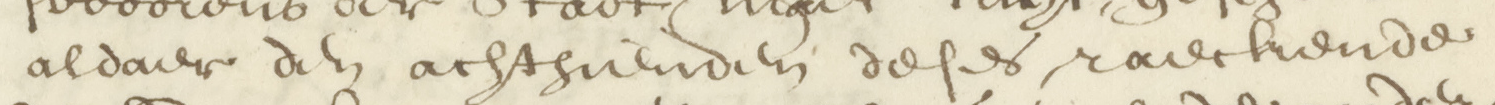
aldaer den achthienden deses, raeckende
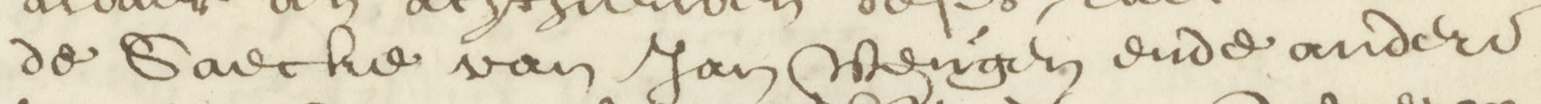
de Saecke van Jan Veugen ende andere
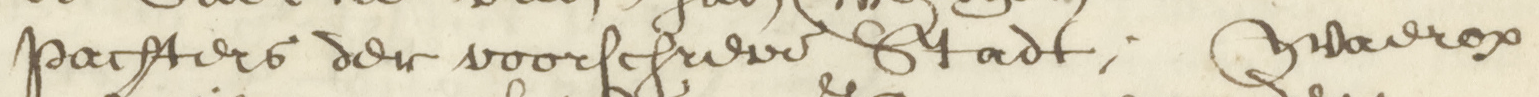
pachters der voorschreve Stadt; Waerop
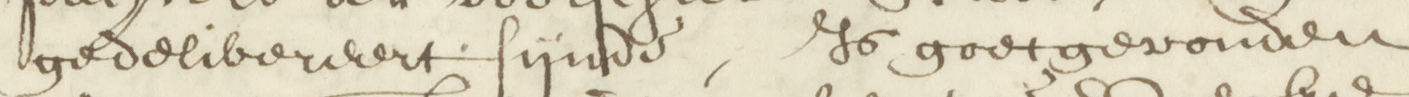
gedelibereert sijnde, Is goetgevonden
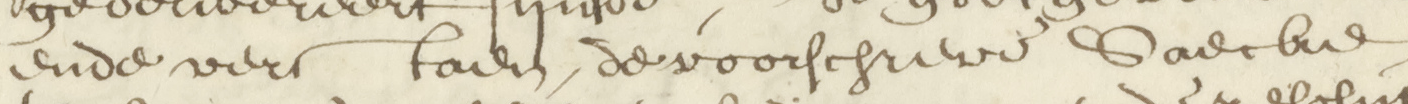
ende verstaen, de voorschreve Saecke
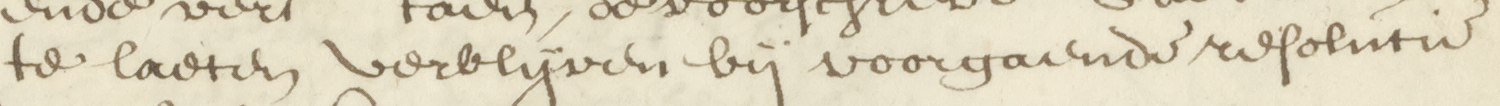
te laeten verblijven bij voorgaende resolutie
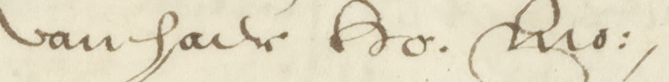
van haer Ho:Mo:.
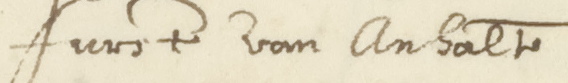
Furst van Anhalt
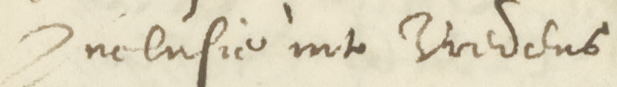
Inclusie int Vredens
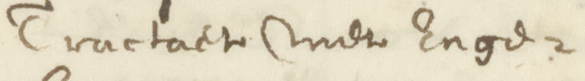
Tractaet met Enge„
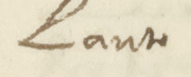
Lant
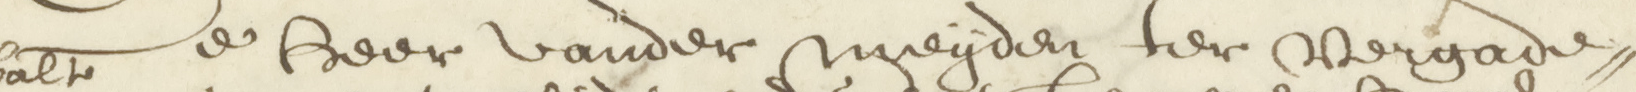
De heer vander Meijden ter Vergade„
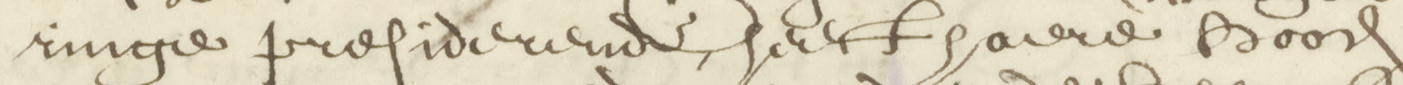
ringe presiderende, heeft haere Hooch
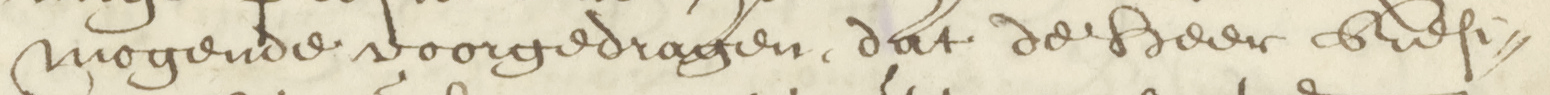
mogende voorgedragen, dat de Heer Resi„
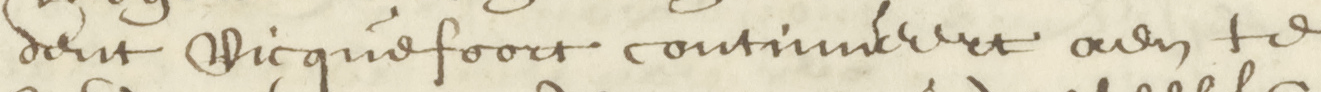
dent Vicquefoort continueert aen te
